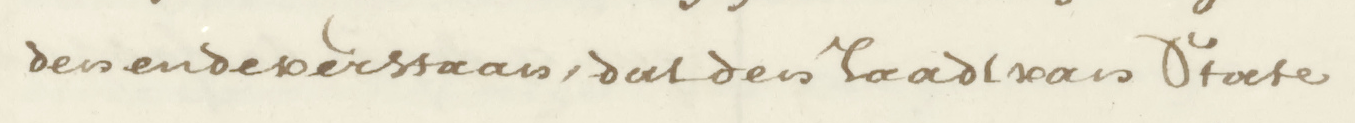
den ende verstaan, dat den Raadt van State
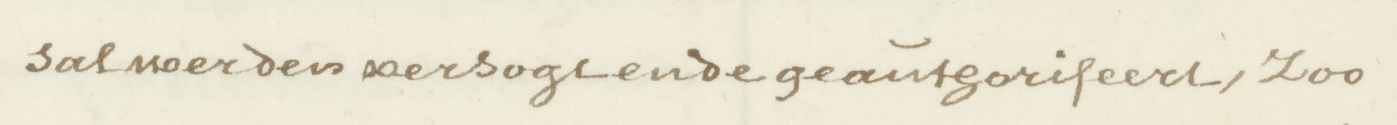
sal werden versogt ende geauthoriseert, zoo
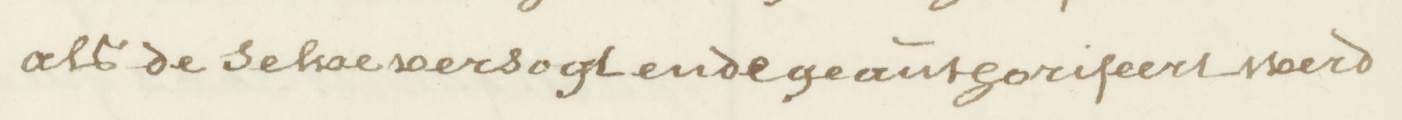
als de selve versogt ende geauthoriseert werd
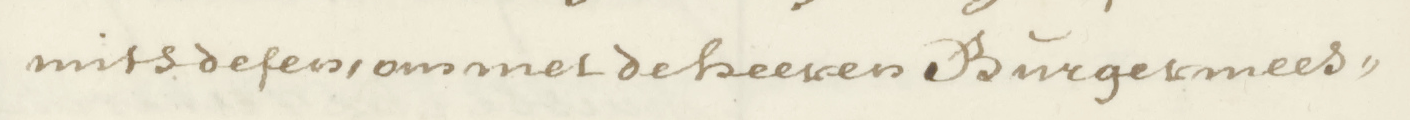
mits desen, om met de heeren Burgermees„
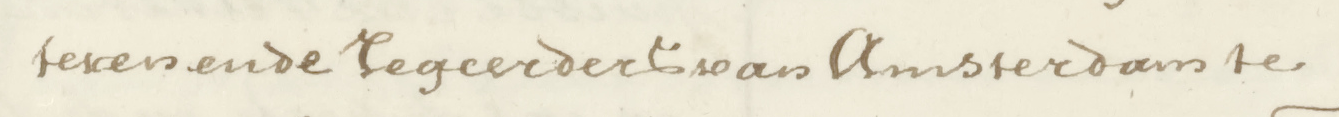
teren ende Regeerders van Amsterdam te
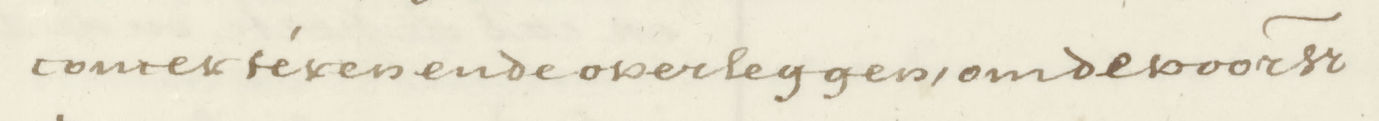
concerteren ende overleggen, om de voorsz
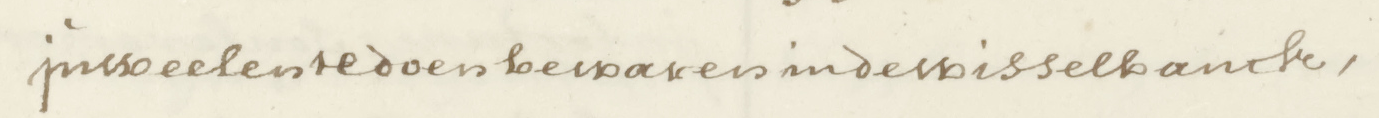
juweelen te doen bewaren inde wisselbanck,
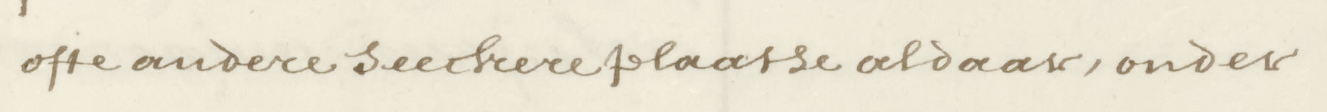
ofte andere seeckere plaatse aldaar, onder
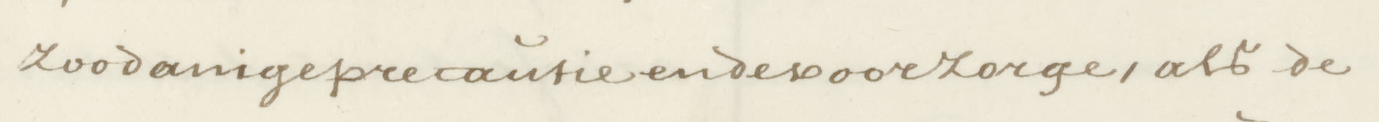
zoodanige precautie ende voorzorge, als de
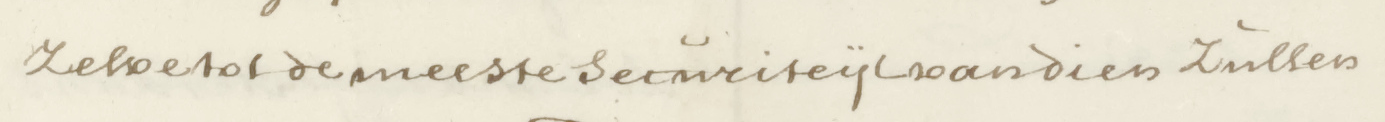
zelve tot de meeste securiteijt vandien zullen
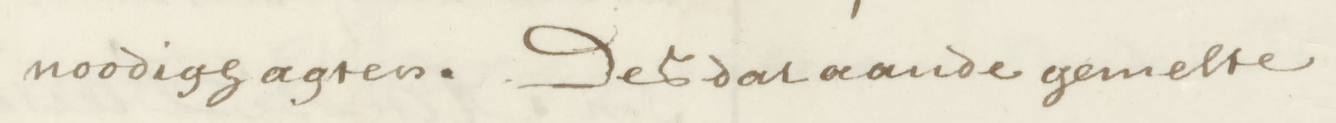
noodigh agten. Des dat aande gemelte
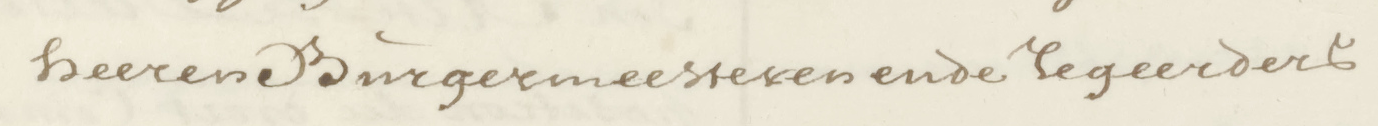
heeren Burgermeesteren ende regeerders
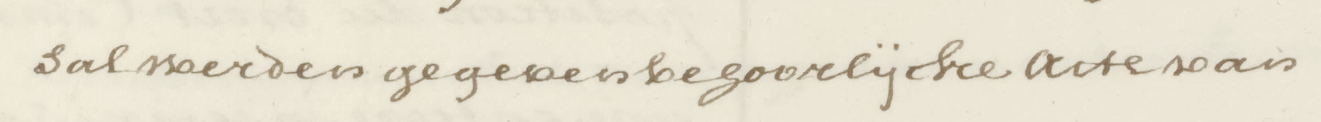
sal werden gegeven behoorlijcke acte van
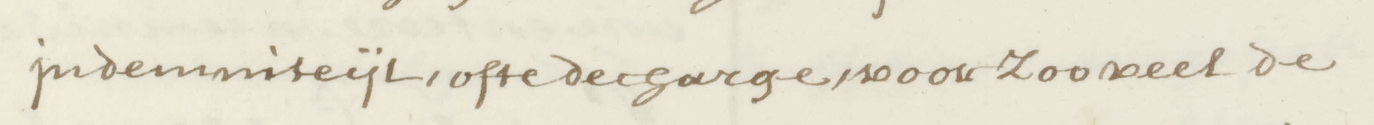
indemmiteijt, ofte decharge, voor zooveel de
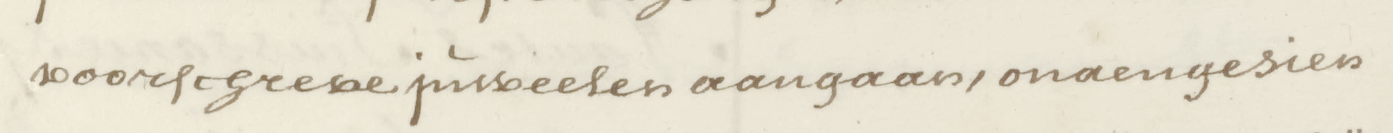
voorschreve juweelen aangaan, onaengesien
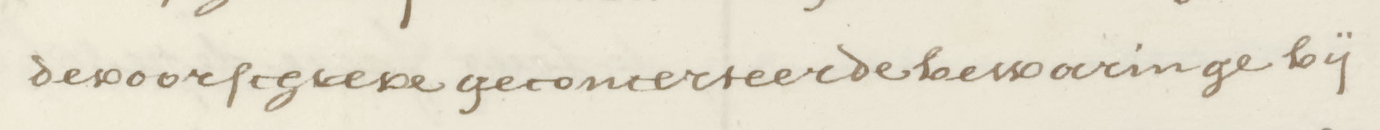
de voorschreve geconcerteerde bewaringe bij
